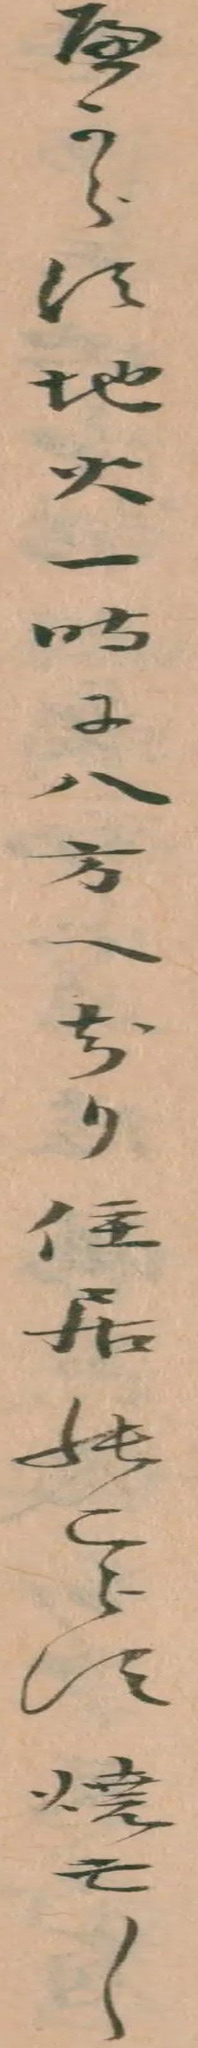べからず地火一時に八方へちり住居のこらす焼亡し
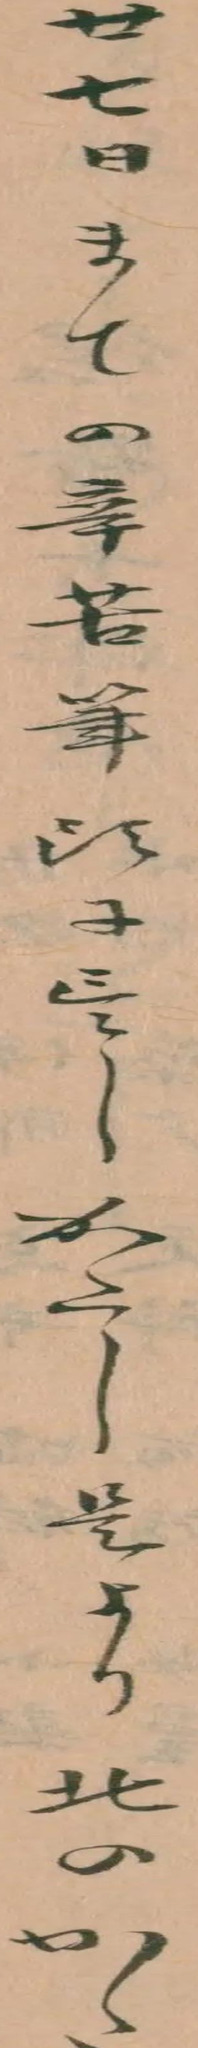廿七日までの辛苦筆紙に尽しかたし是より北のかた
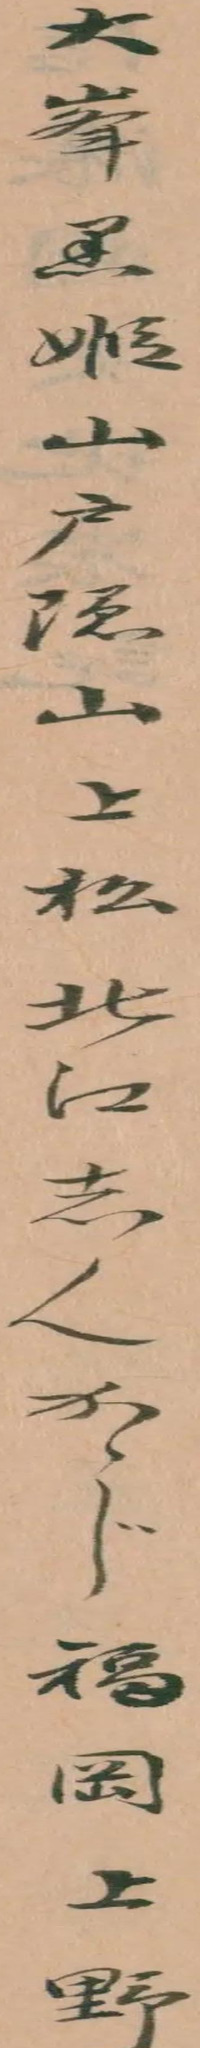大峯黒姫山戸隠山上松北郷しんかうじ福岡上野
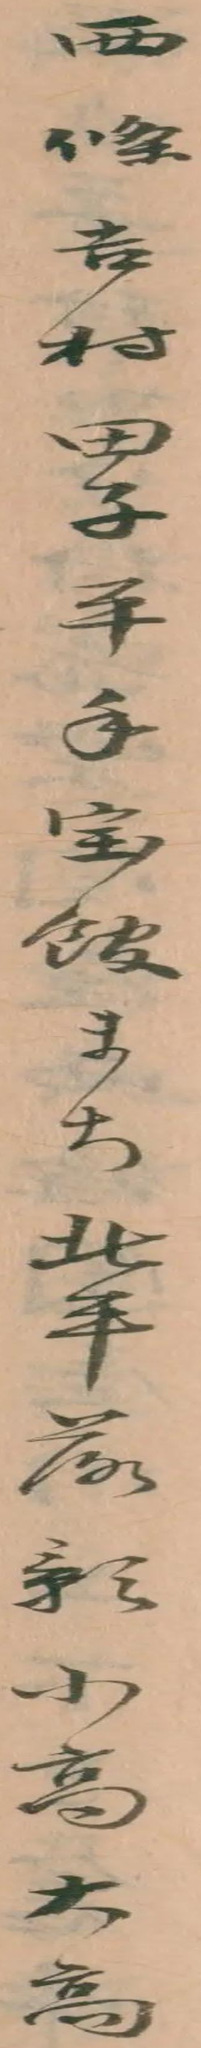西条吉村田子平手宝飯まち北平落影小高大高
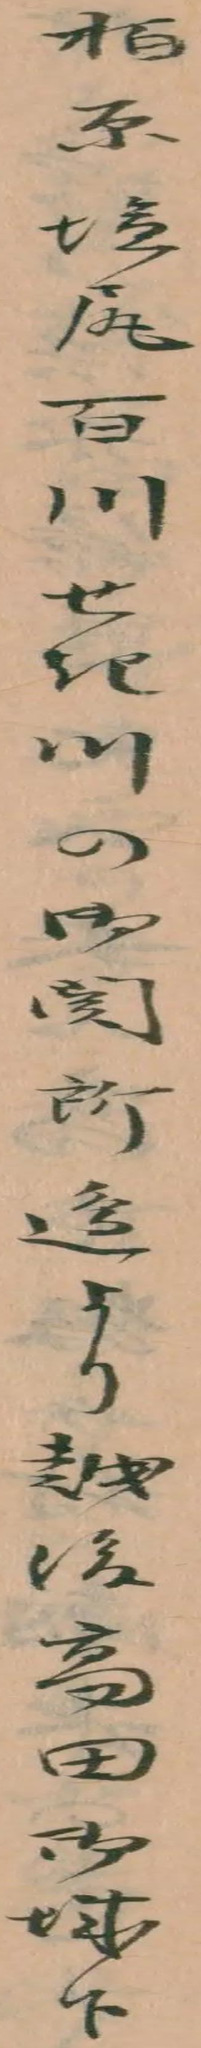柏原塩尻百川せき川の御関所辺より越後高田御城下
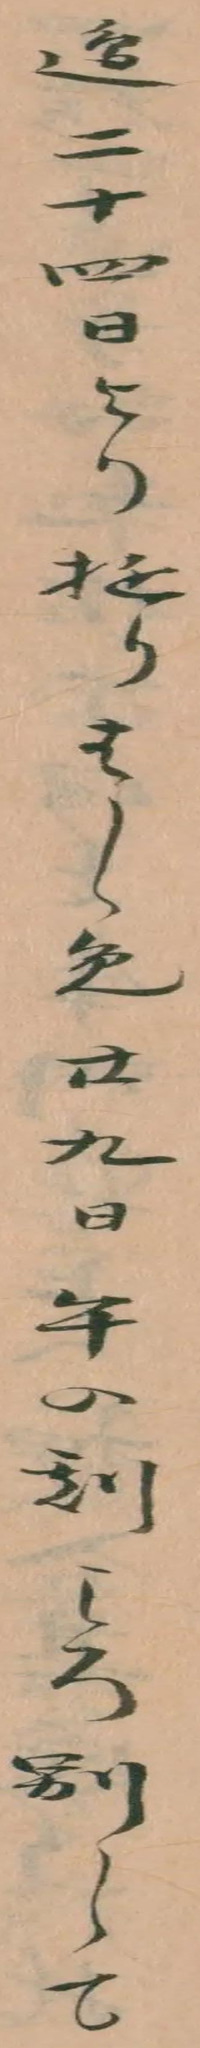辺二十四日よりゆりはじめ廿九日午の刻ころ別して
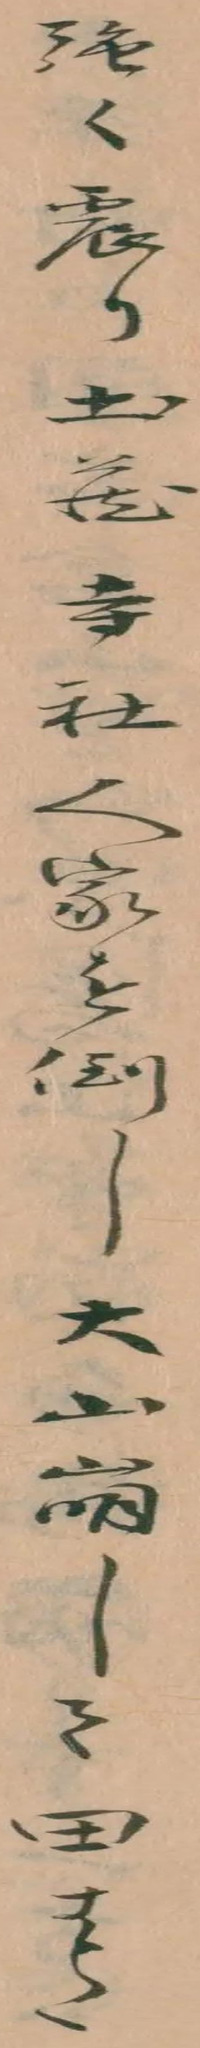強く震り土蔵寺社人家を倒し大山崩して田はた
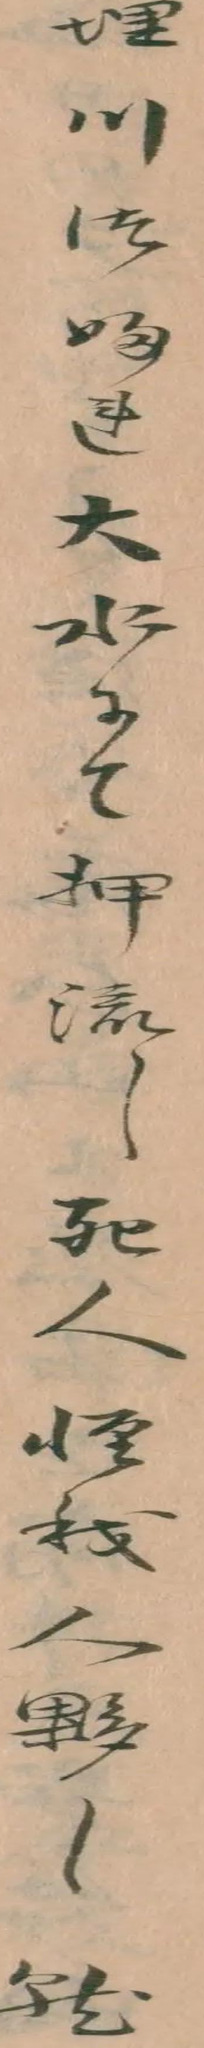埋川あふれ大水にて押流し死人怪我人夥し就
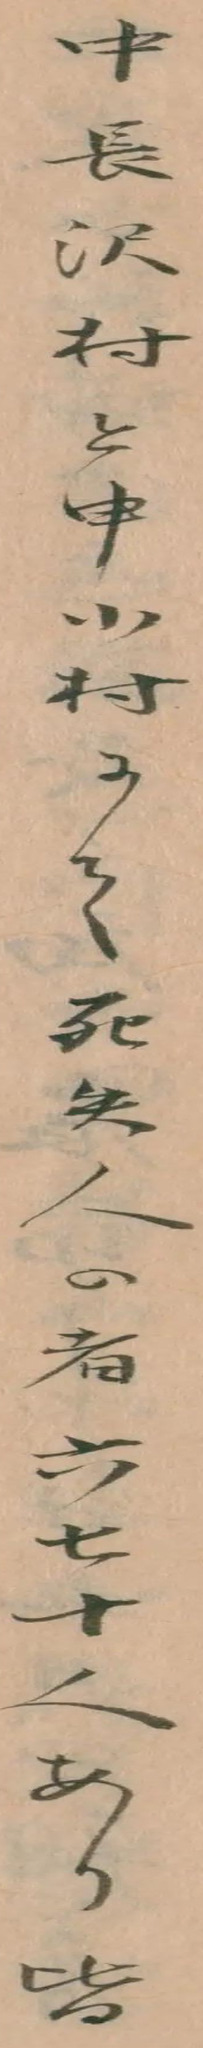中長沢村と申小村にて死失の者六七十人あり皆
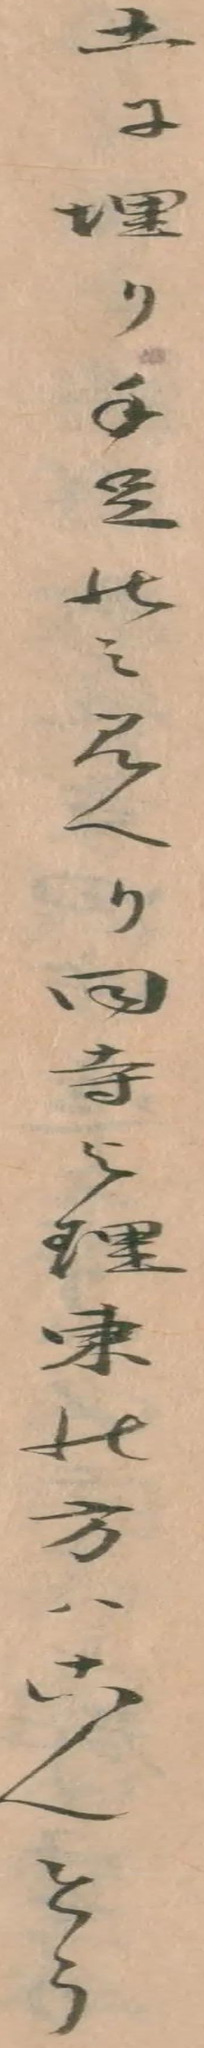土に埋り手足のミ見へりこれハ同寺より東の方ハこんとう
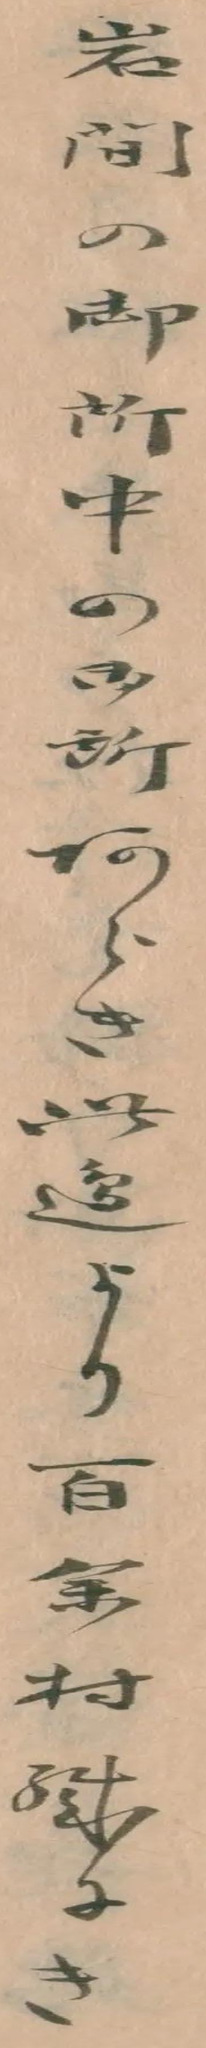岩間の御所中の御所あらき此辺より百余村殊にき
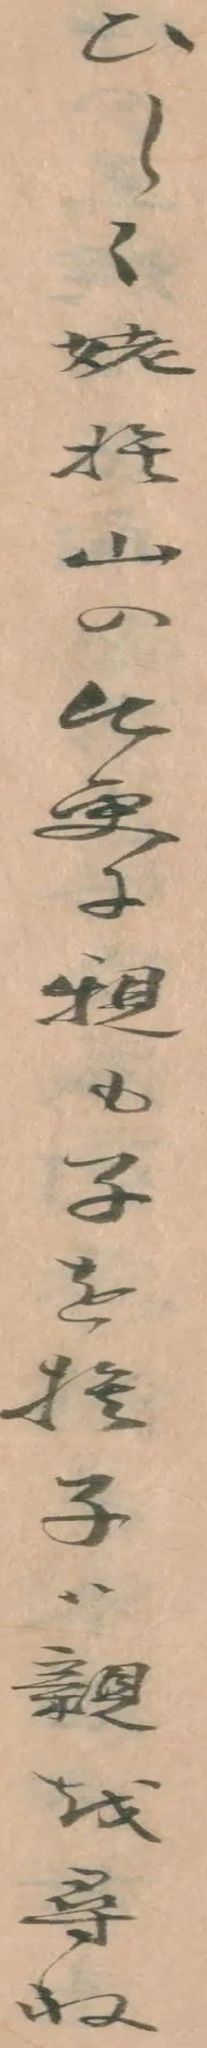びしく姥捨山の今更に親も子を捨子ハ親を尋ね
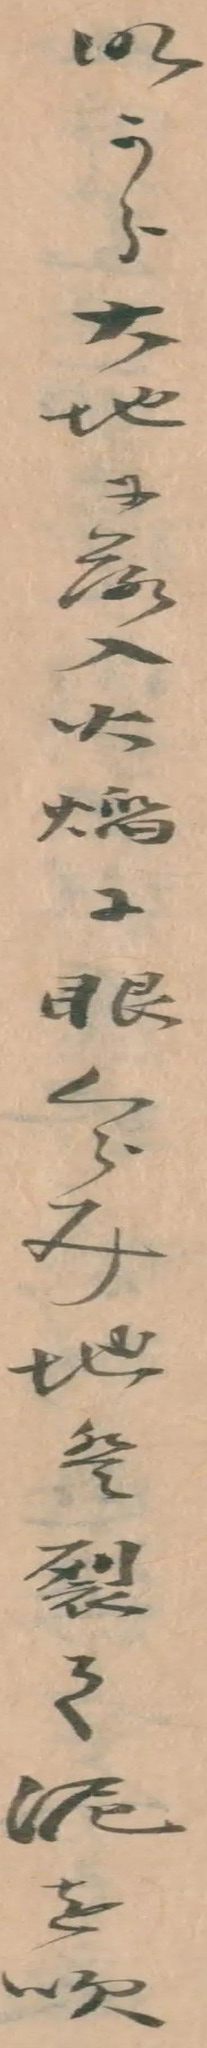なから大地に落入火焔に眼くらみ地は裂て泥を吹

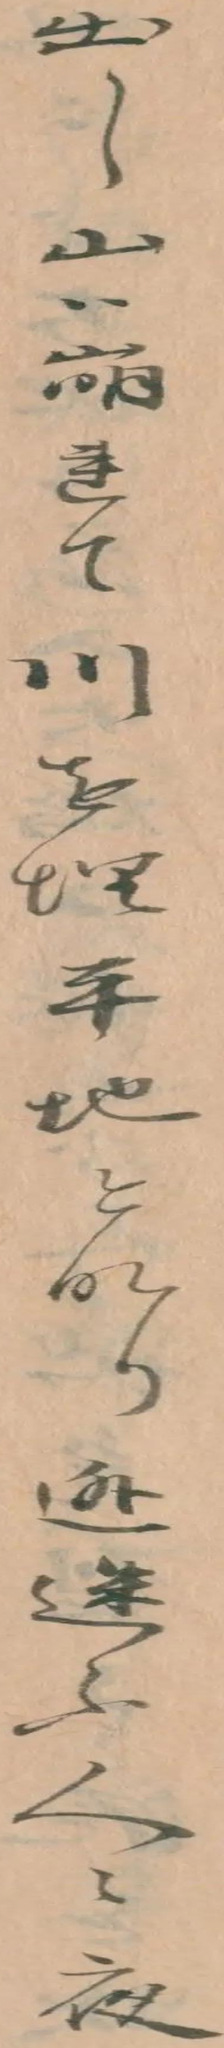出し山ハ崩て川を埋平地となり逃迷ふ人々夜
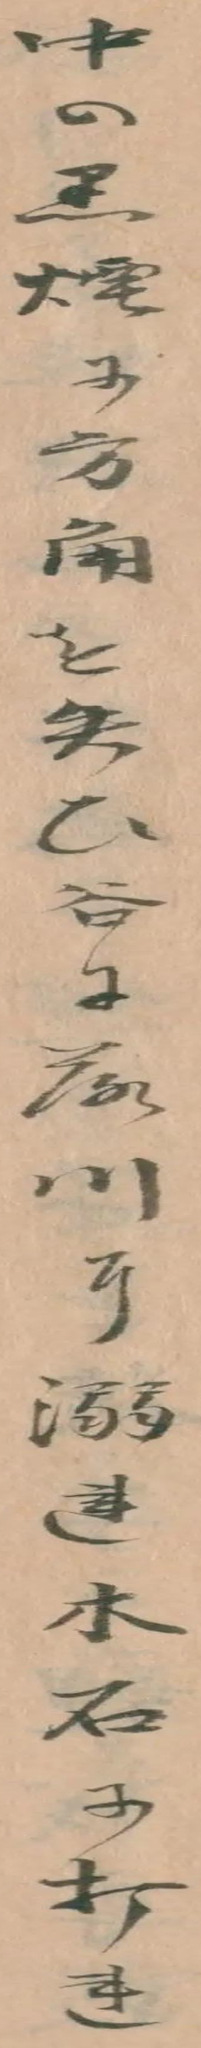中の黒煙に方角を失ひ谷に落川に溺れ木石に打れ
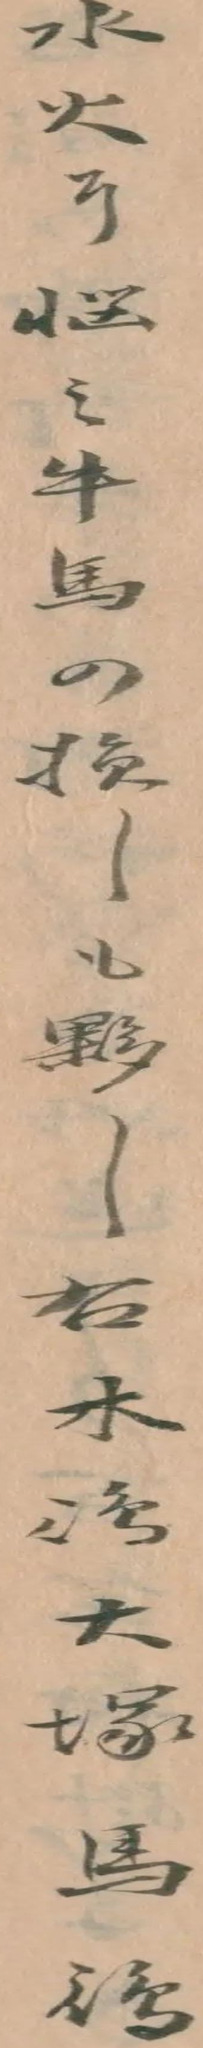水火に悩ミ牛馬の損しも夥し右木嶋大塚馬嶋
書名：地災撮要. 巻3(地震之部)-巻4(噴火之部)
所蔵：国立国会図書館 National Diet Library, JAPAN
